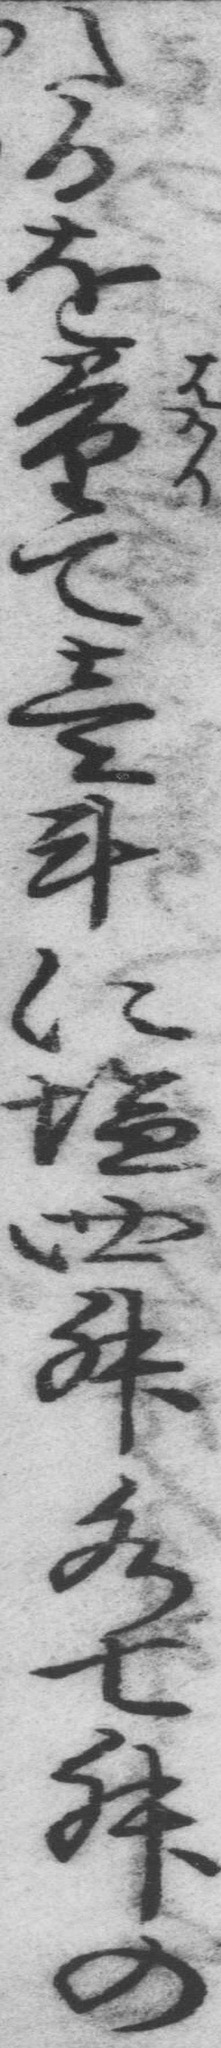たるを量て壱斗に塩四升水七升の
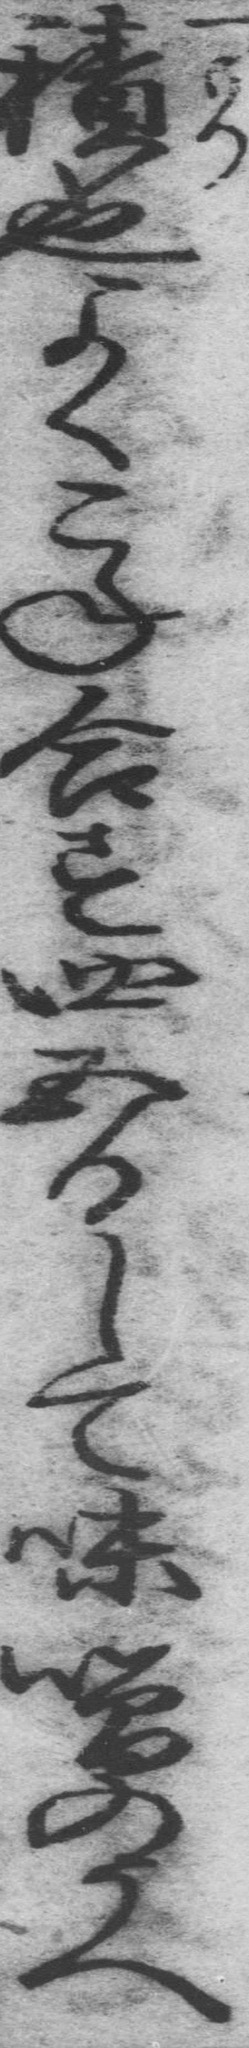積也よくこね合す四五日して味噌のうへ

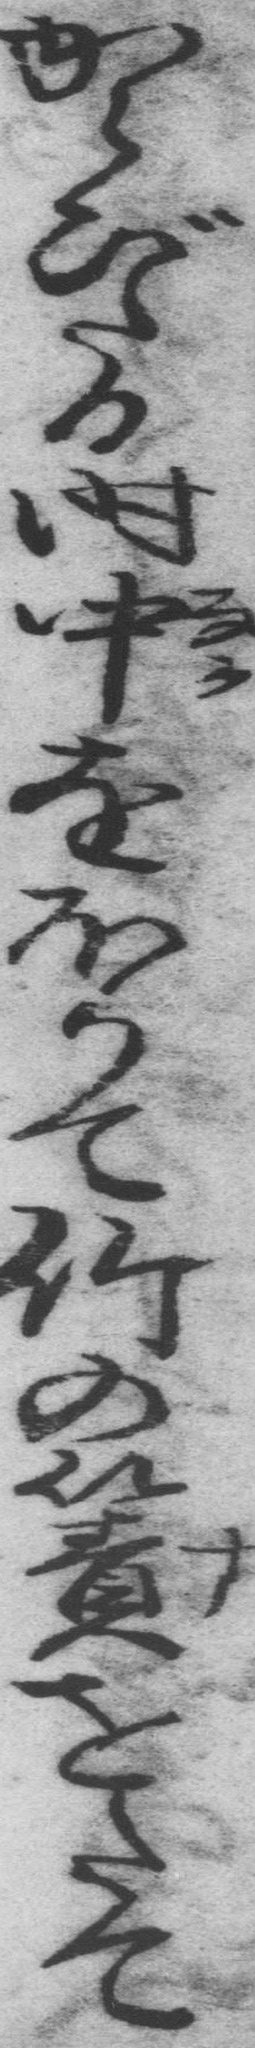からびたる時中をほりて竹の簀をたて
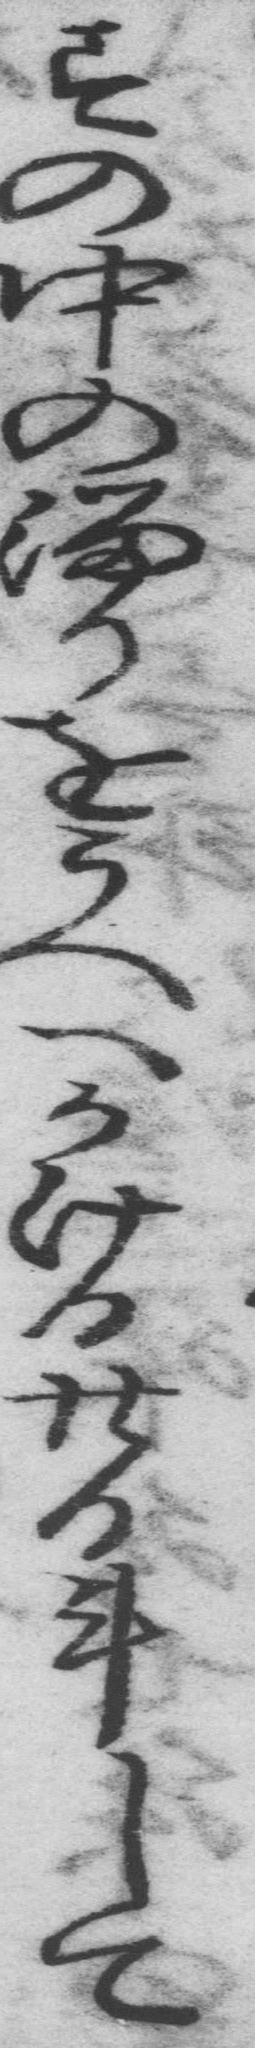すの中の溜りをうへへかける廿日斗して
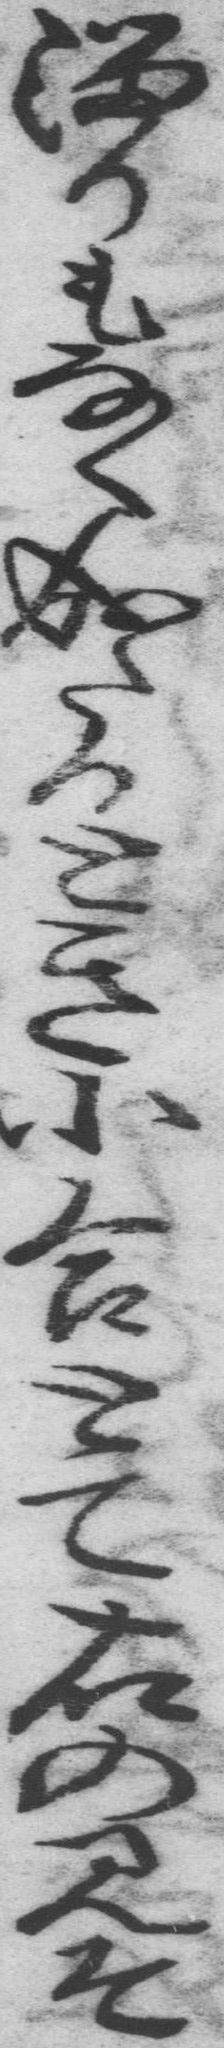溜りもなく成たつとき小合とて右のみそ
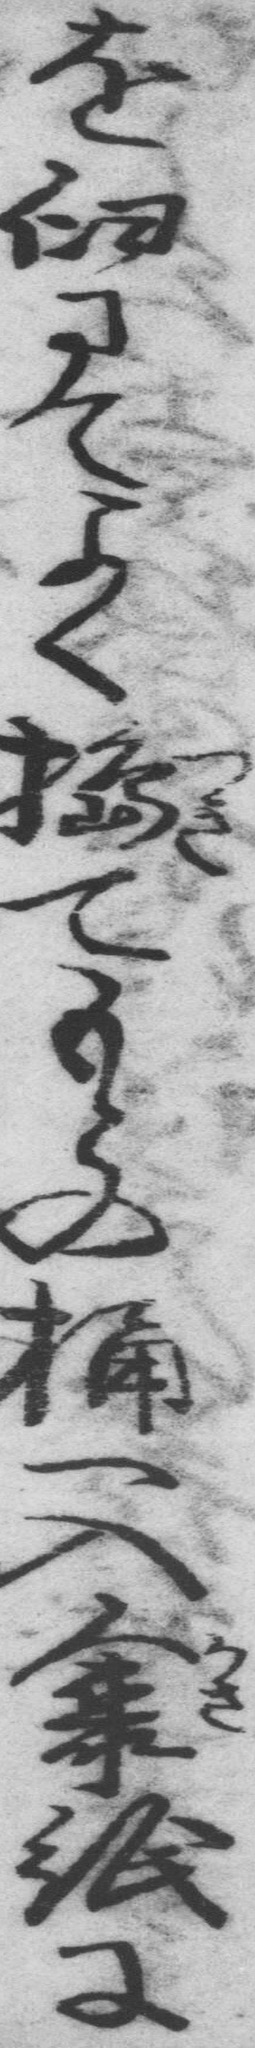を臼にてよく搗てもとの桶へ入傘紙に
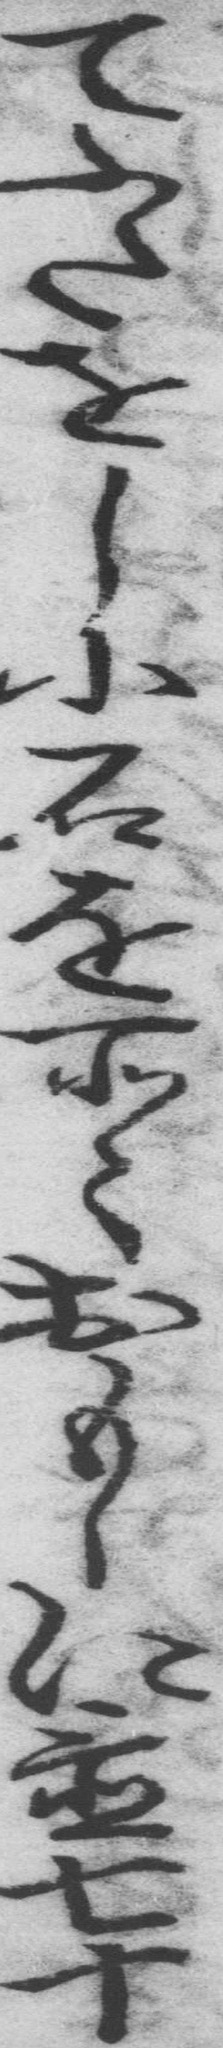てふたをし小石を所々おもしに置七十
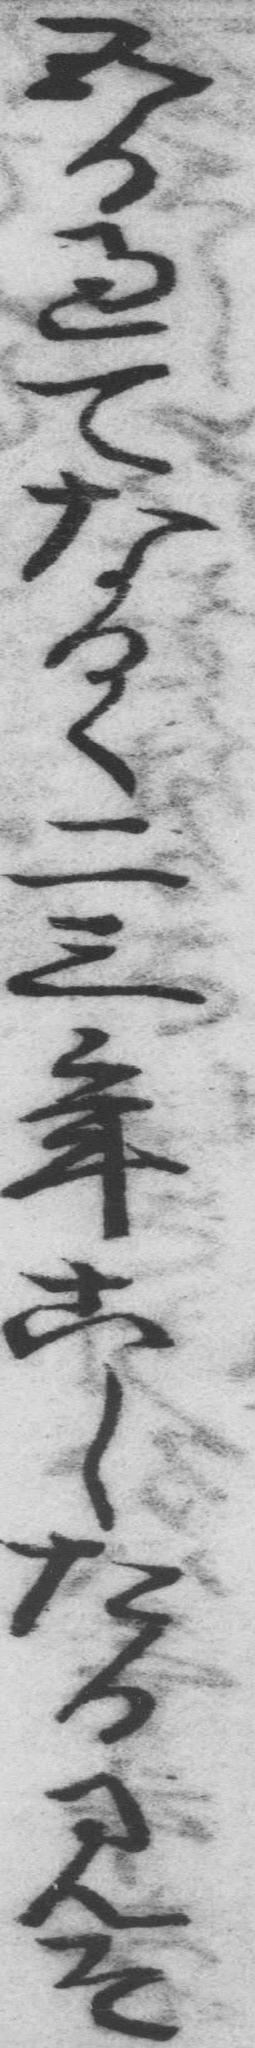五日過てなるく二三年こしたるみそ
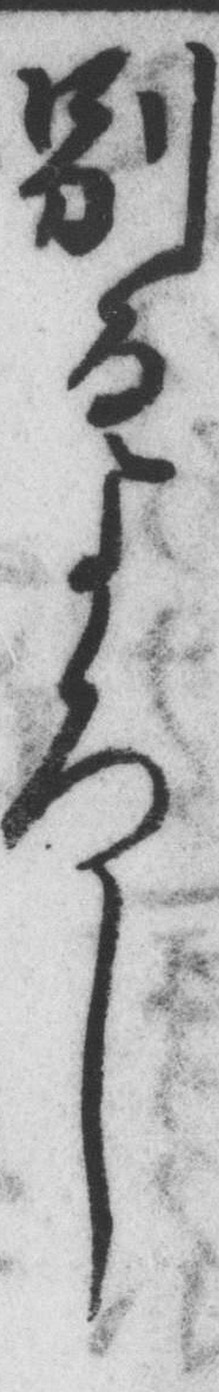別てよろし
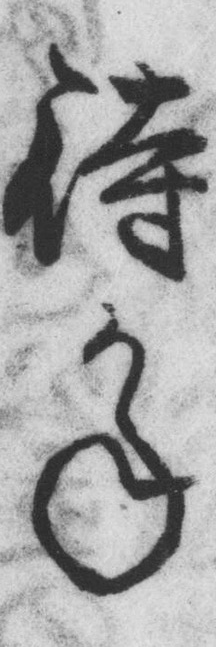待かね
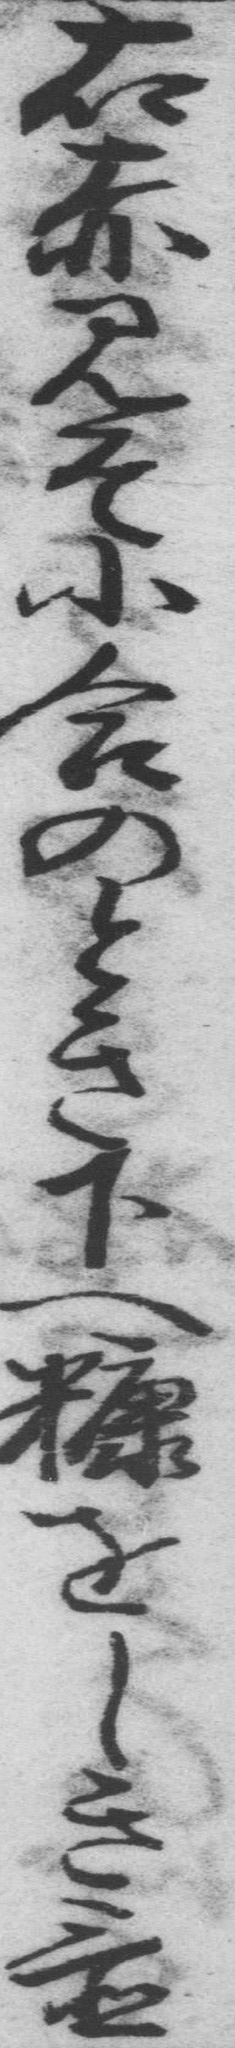右赤みそ小合のとき下へ糠をしき置
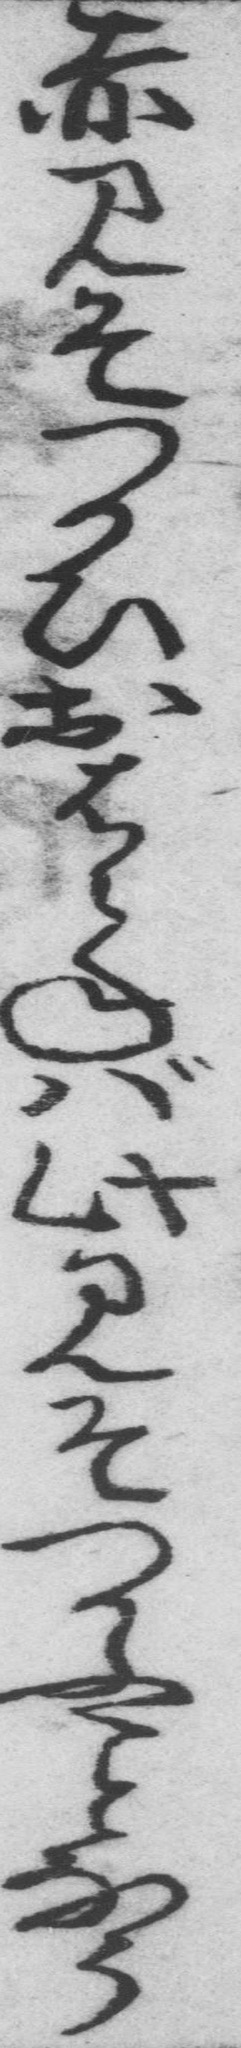赤みそつかひおはらねば此みそつかふことなら
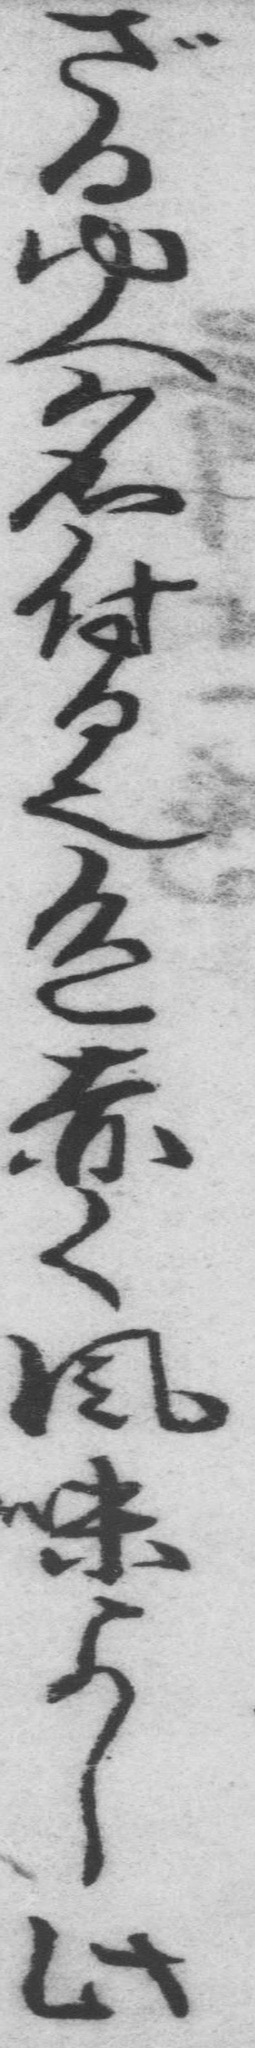ざるゆへ名付る也色赤く風味よし此
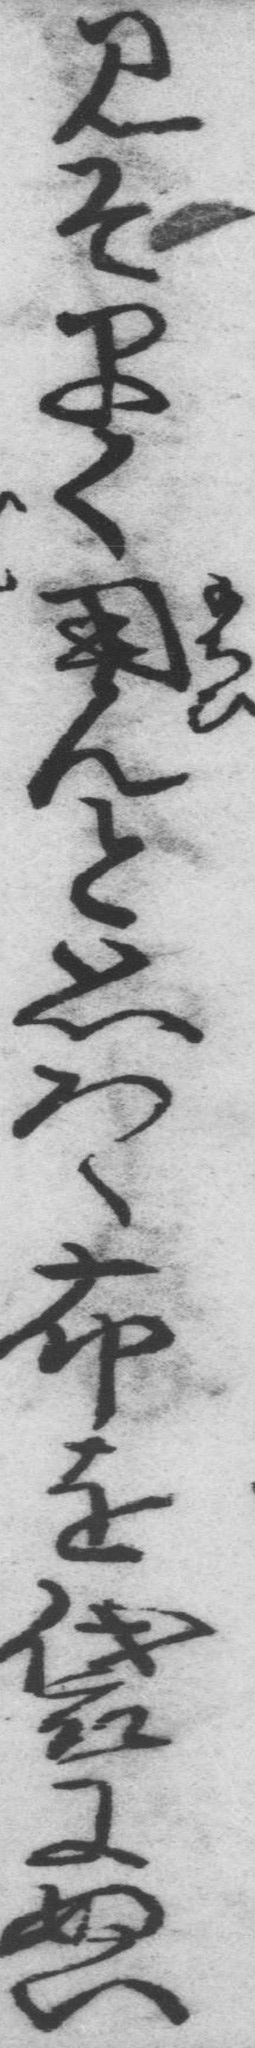みそ早く用んと思はゝ布を袋にぬい
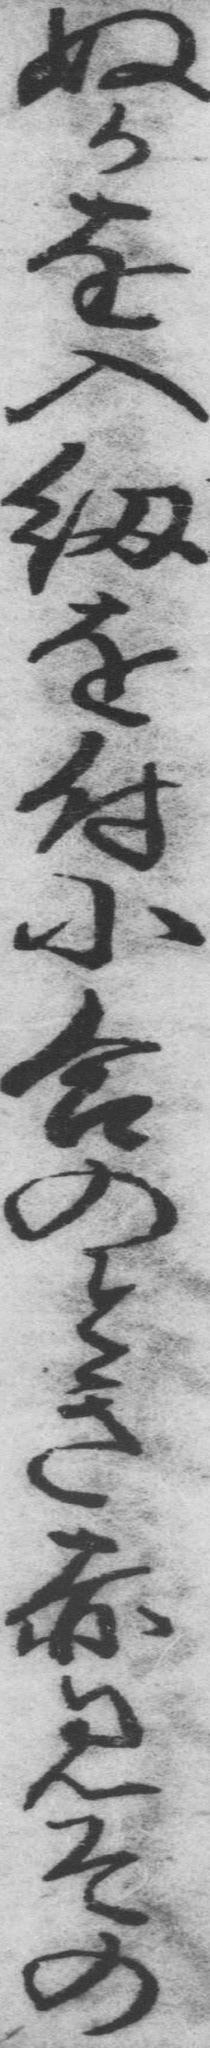ぬかを入紐を付小合のとき赤みその
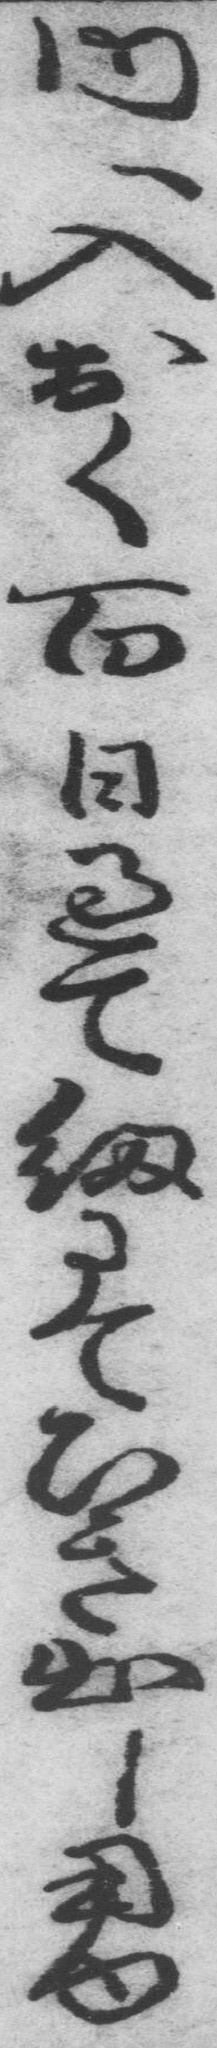内へ入おく百日過て紐にてひき出し用ゆ
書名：料理山海郷
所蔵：大阪府立大学学術情報センター 国文学研究資料館
